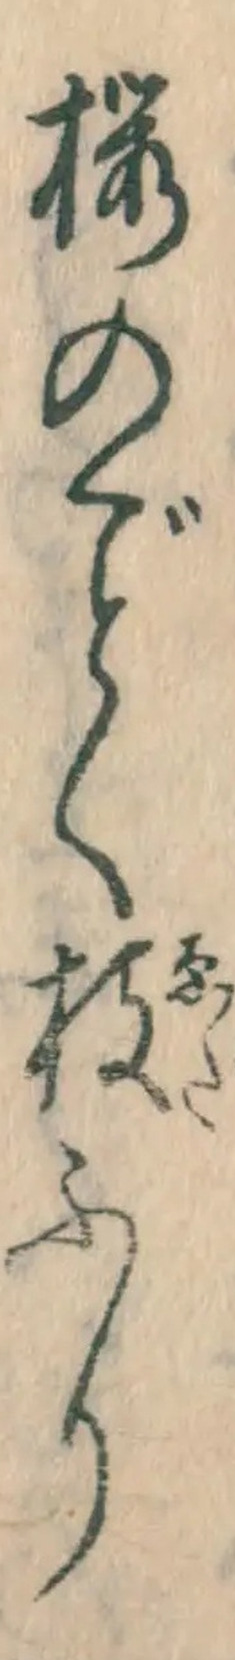桜のごとく枝ふり

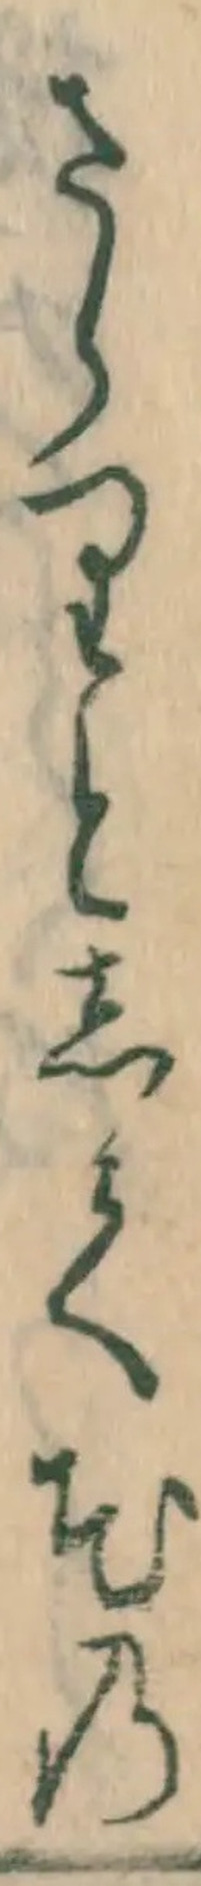さらりとして花の
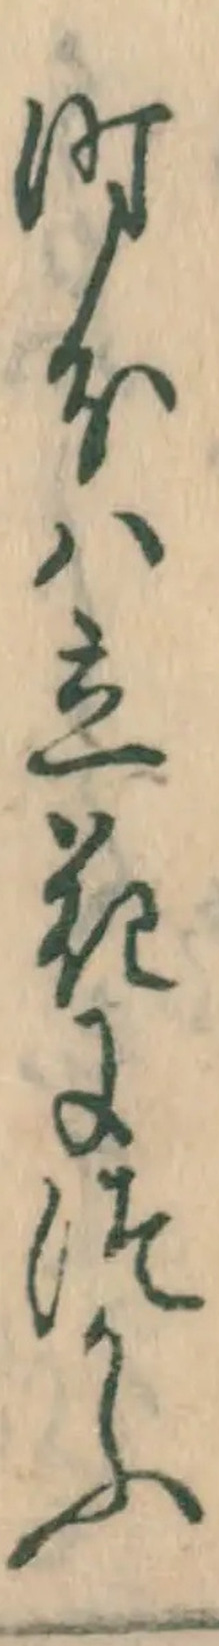時分は立花につかふ
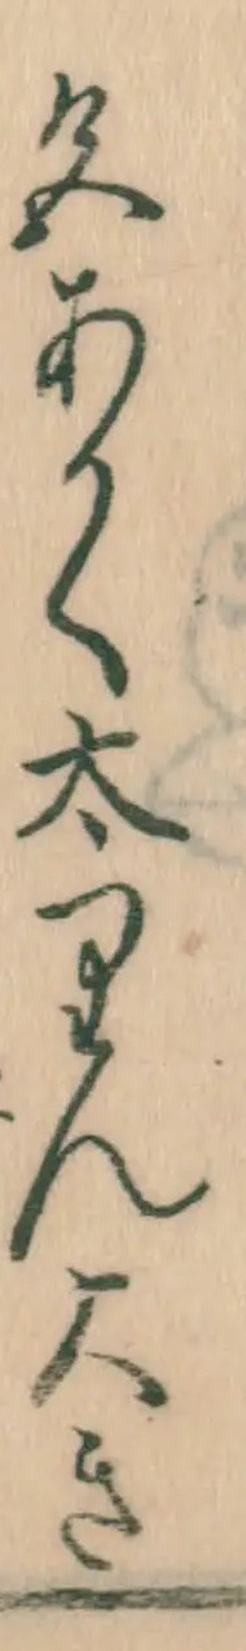色あかく太りん大き
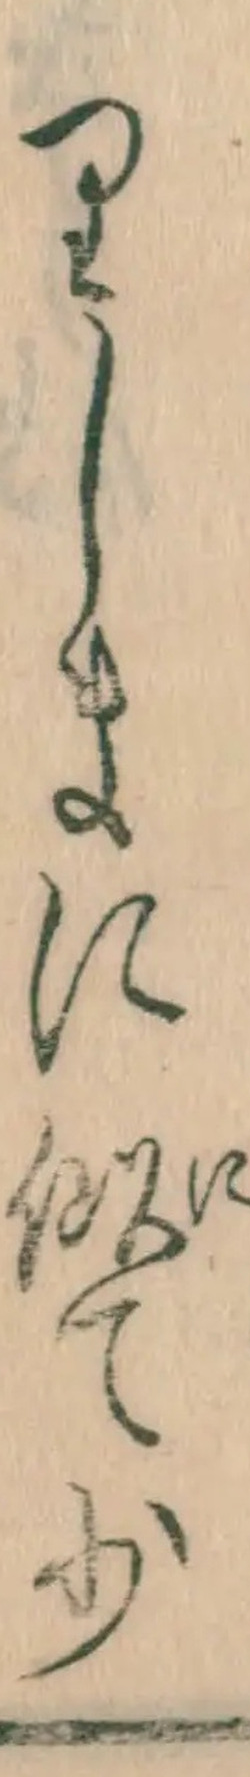りしまに似て少
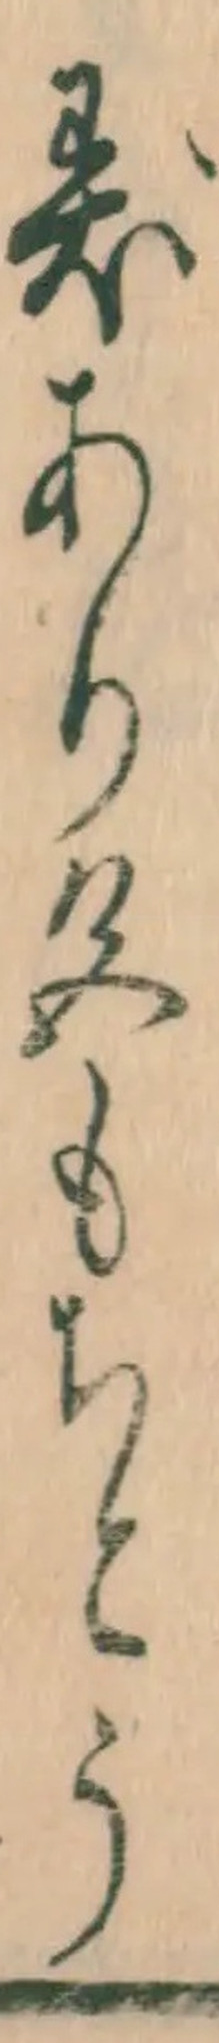異あり色もちとう
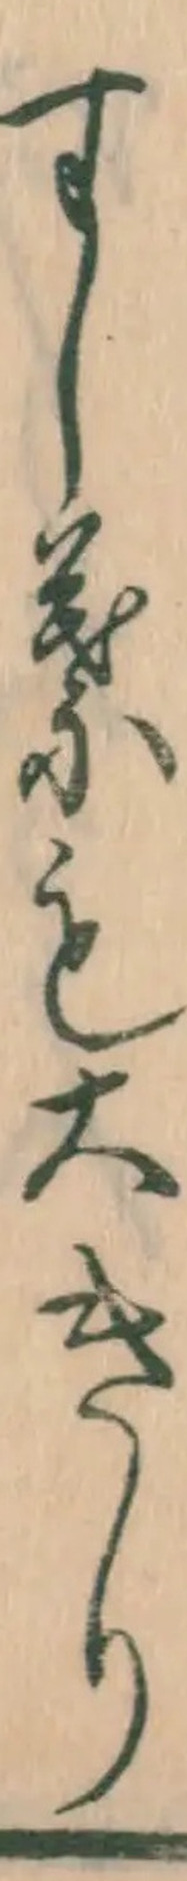すし葉も大きり
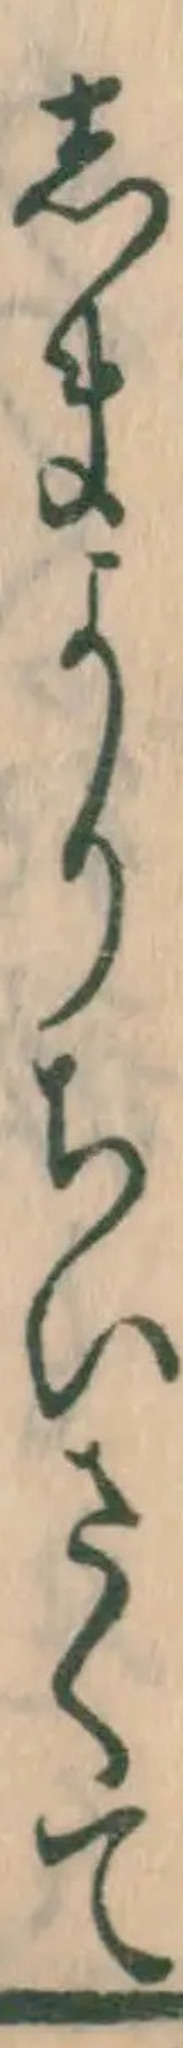しまよりちいさくて
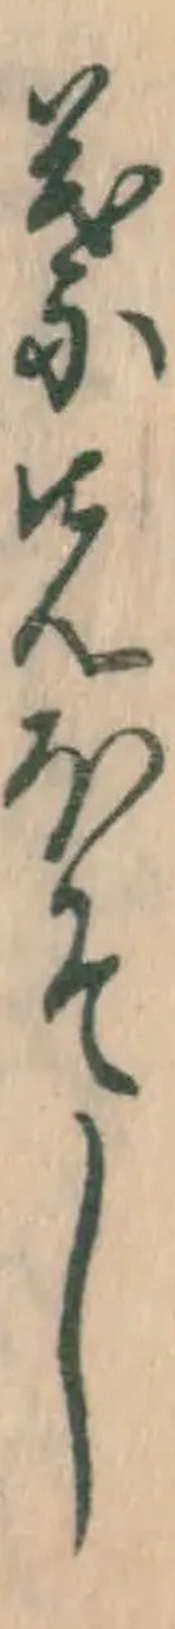葉先ほそし
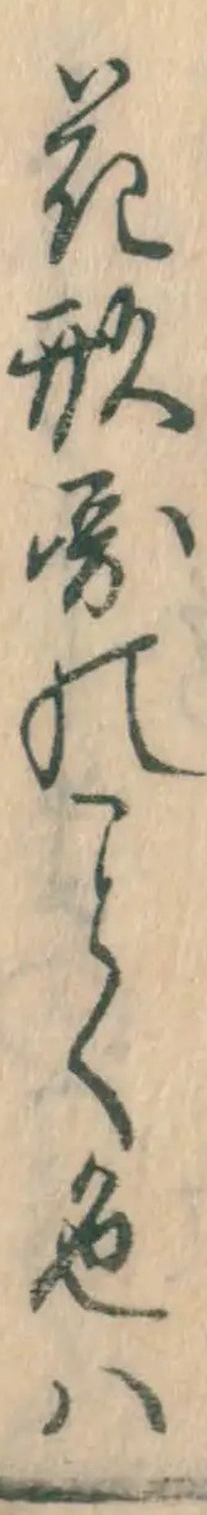花形図のことく色は

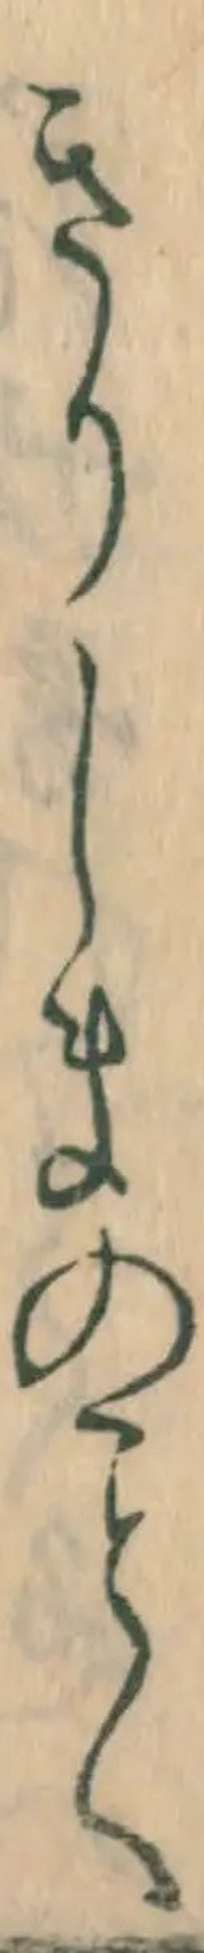きりしまのことく
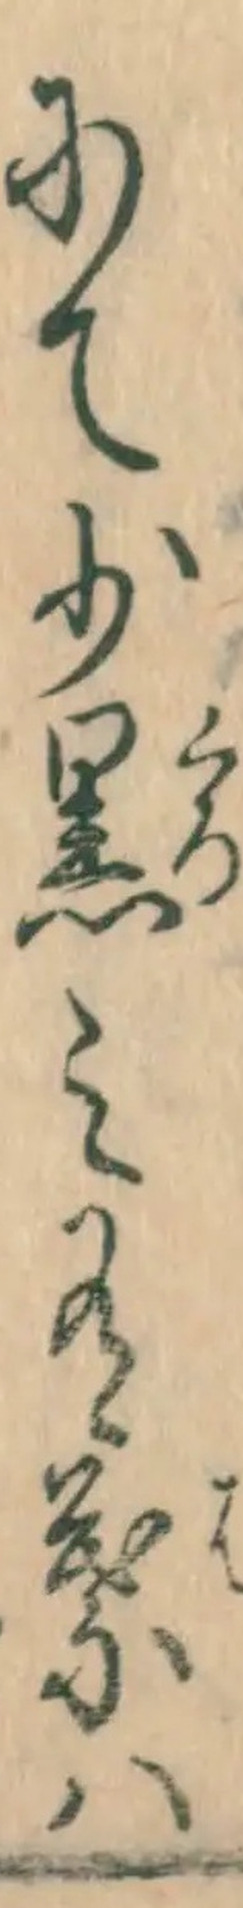にて少黒み有葉は
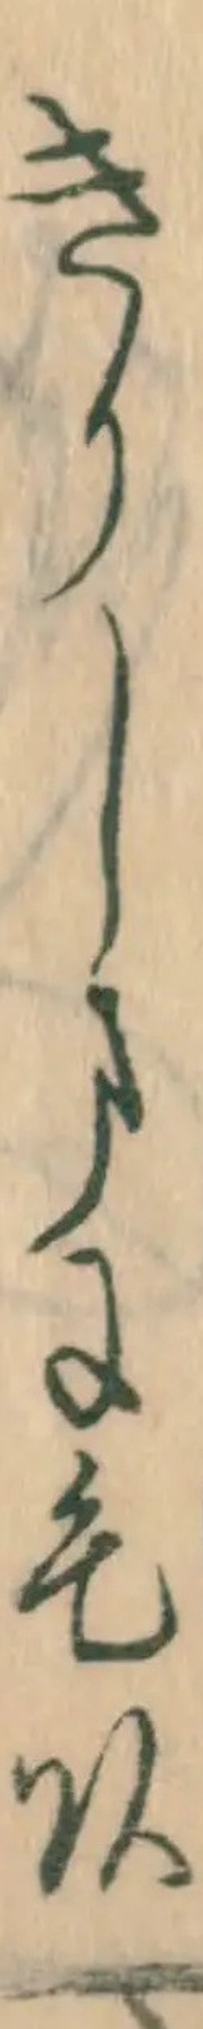きりしまに毛頭
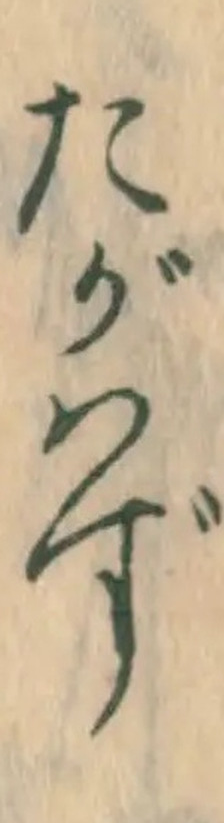たがはず
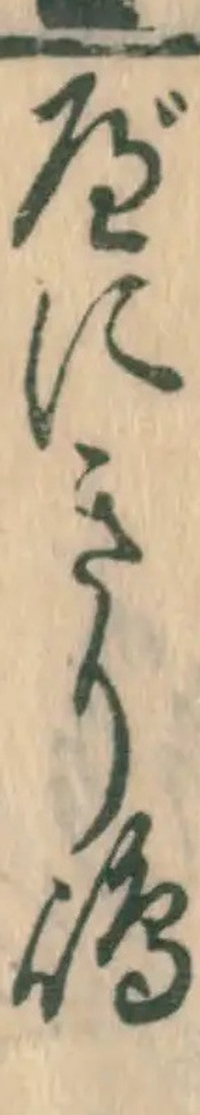べにきり嶋
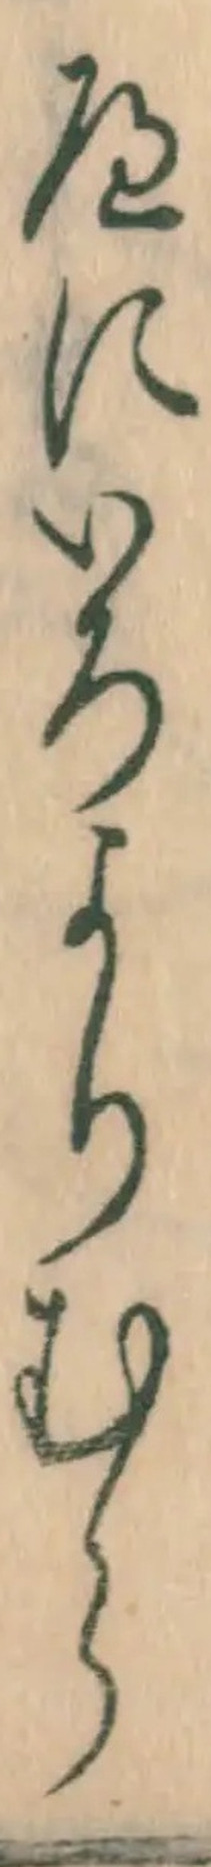へにいろよりむら
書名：錦繍枕 5巻. [1]
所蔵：国立国会図書館 National Diet Library, JAPAN
